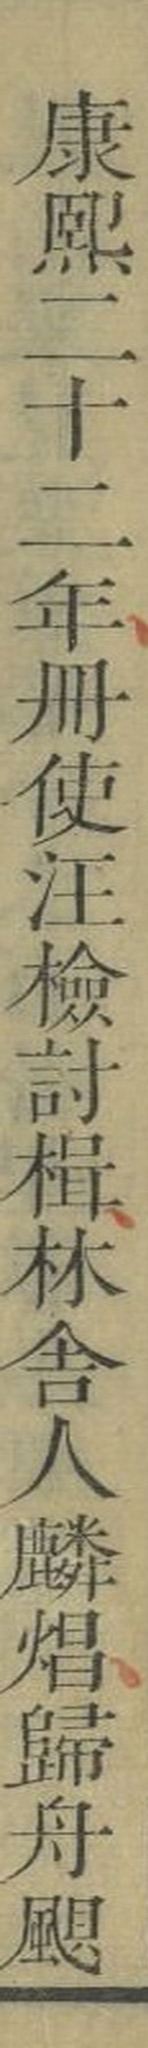康熙二十二年冊使汪檢討楫林舎人麟焻歸舟颶
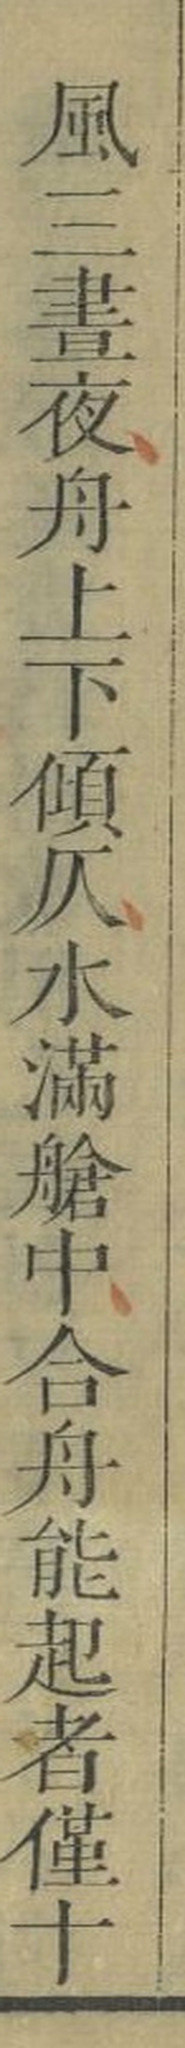風三晝夜舟上下傾仄水滿艙中合舟能起者僅十
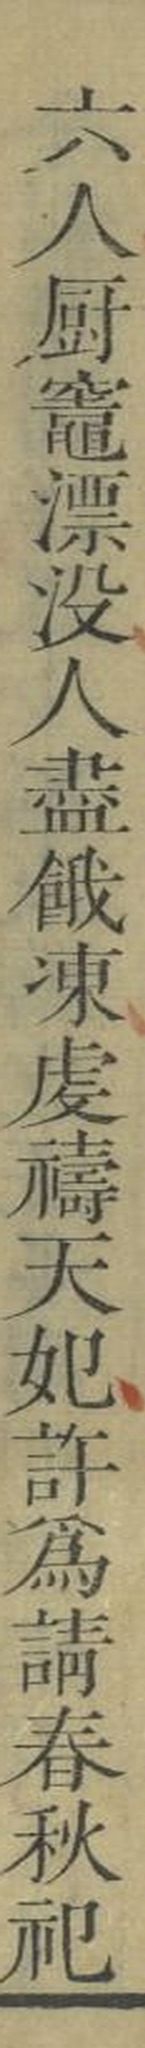六人厨竈漂没人盡餓凍䖍禱天妃許爲請春秋祀
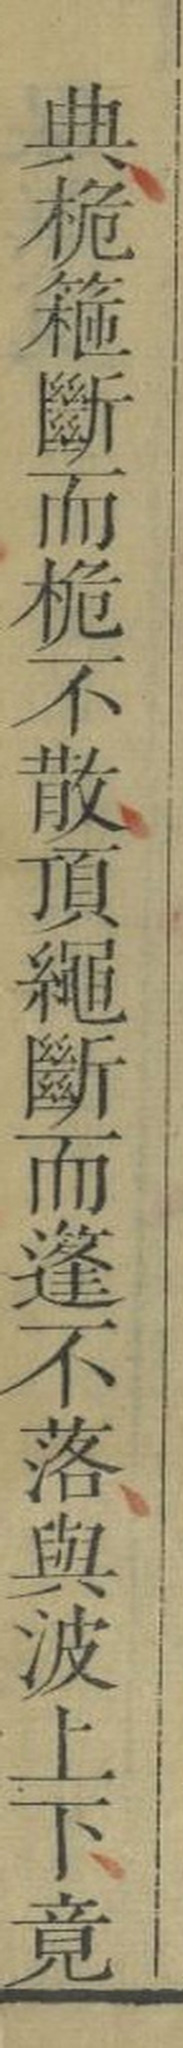典桅篐斷而桅不散頂繩斷而篷不落與波上下竟

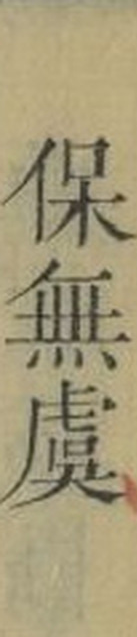保無虞
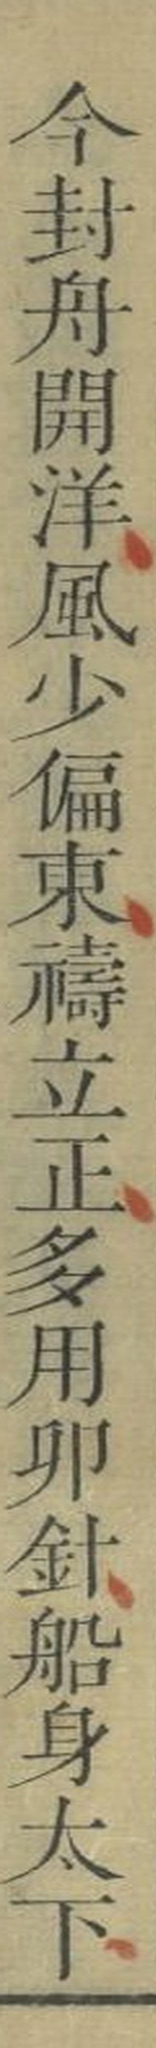今封舟開洋風少偏東禱立正多用卯針船身太下
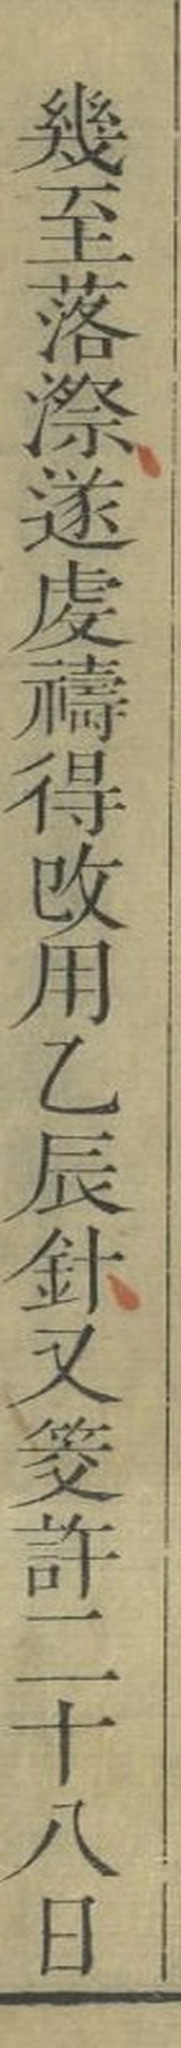幾至落漈遂䖍禱得攺用乙辰針又筊許二十八日
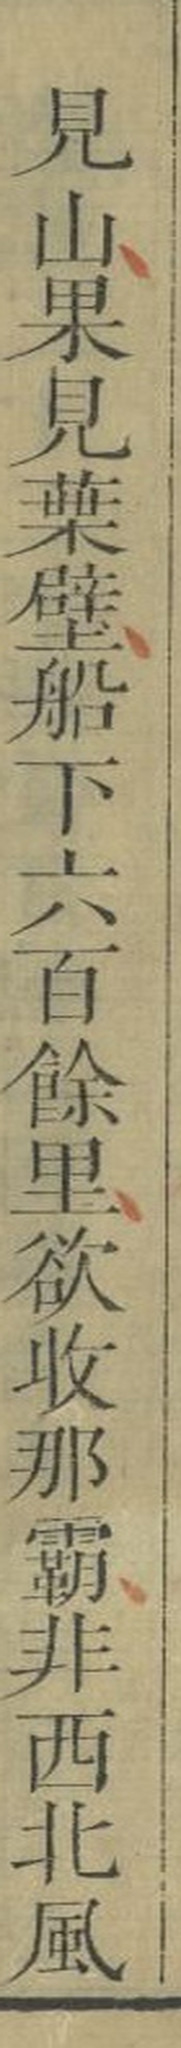見山果見葉壁船下六百餘里欲收那霸非西北風
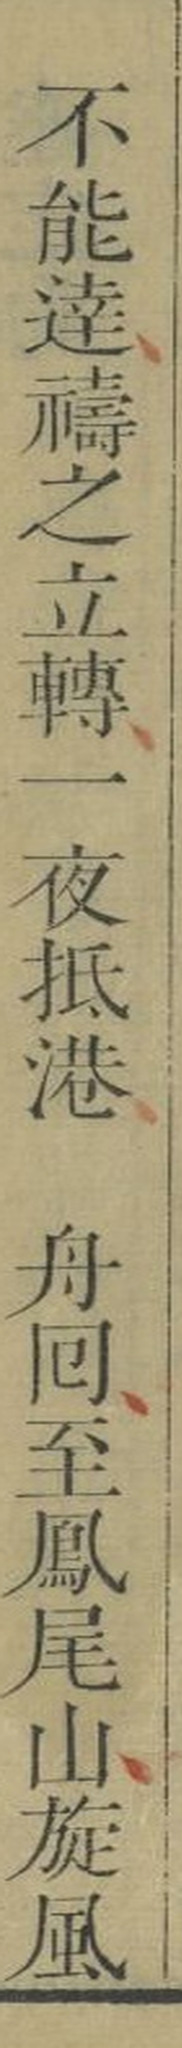不能逹禱之立轉一夜抵港舟囘至鳳尾山旋風
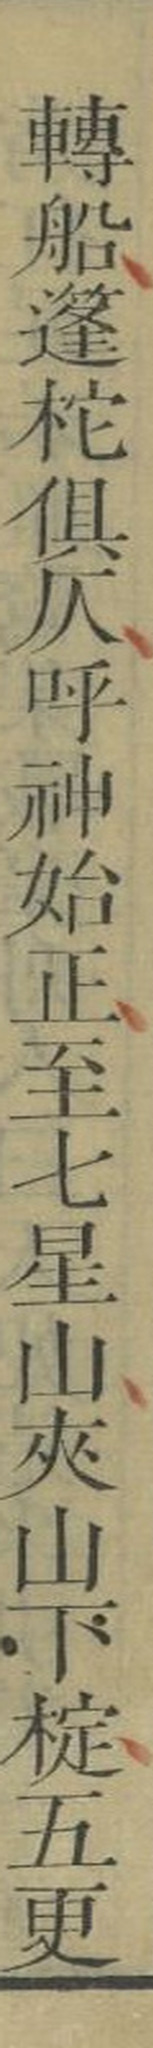轉船篷柁俱仄呼神始正至七星山夾山下椗五更
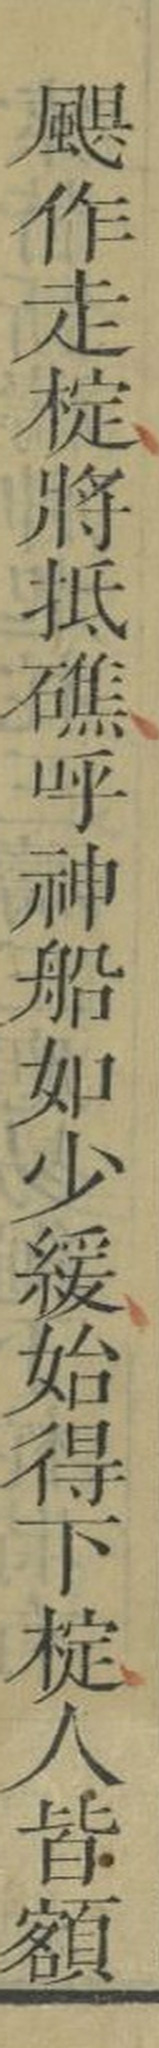颶作走椗將抵礁呼神船如少緩始得下椗人皆額
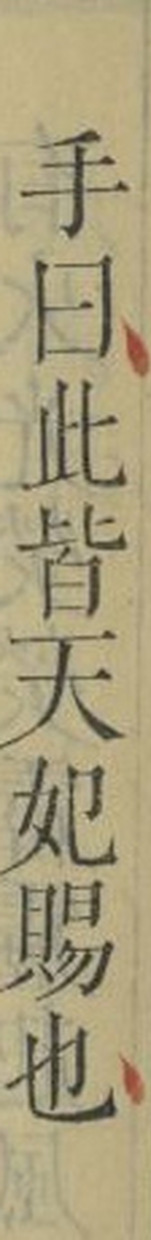手曰此皆天妃賜也
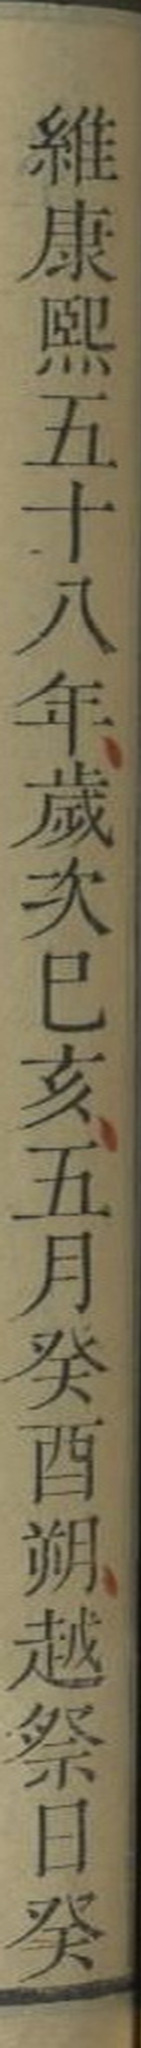維康熙五十八年歲次巳亥五月癸酉朔越祭日癸
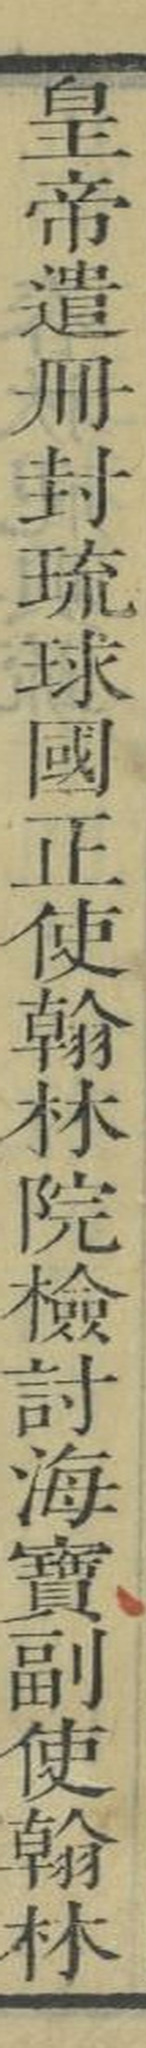皇帝遣冊封琉球國正使翰林院檢討海寶副使翰林
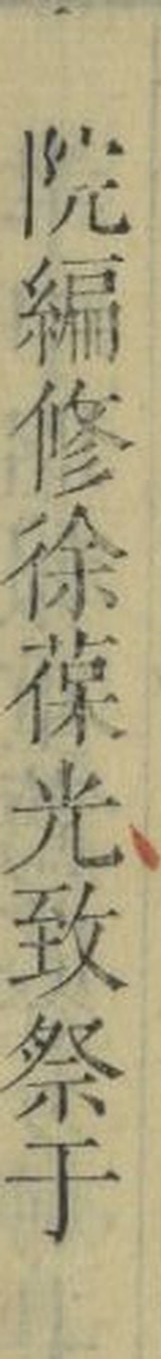院編修徐葆光致祭于
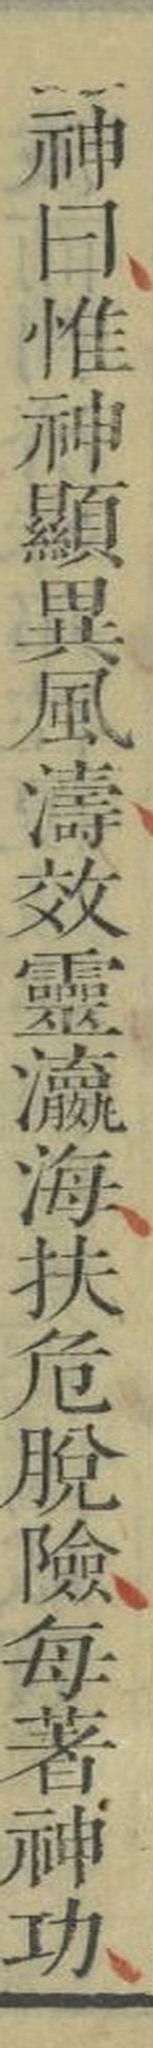神曰惟神顯異風濤效靈瀛海扶危脫險每著神功
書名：中山伝信録 巻一、巻二
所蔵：University of the Ryukyus Library
